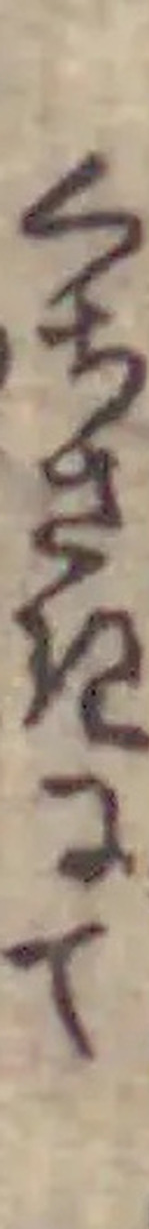くちさきにて
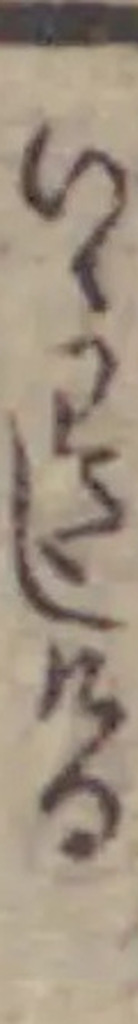いゝわたしける
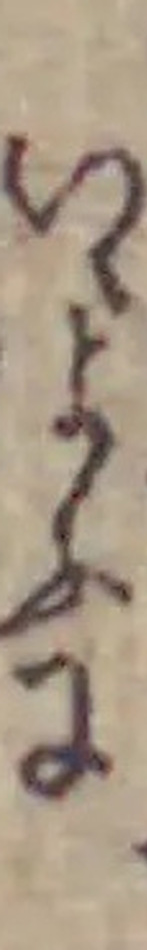いゝよふに
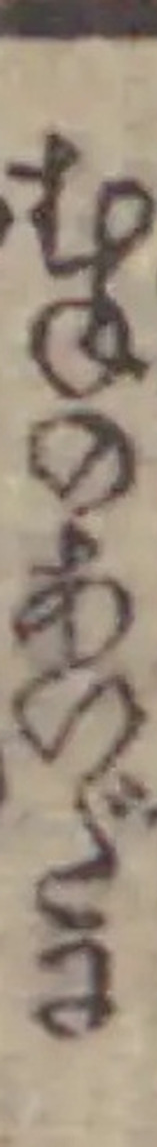むねのあいだに
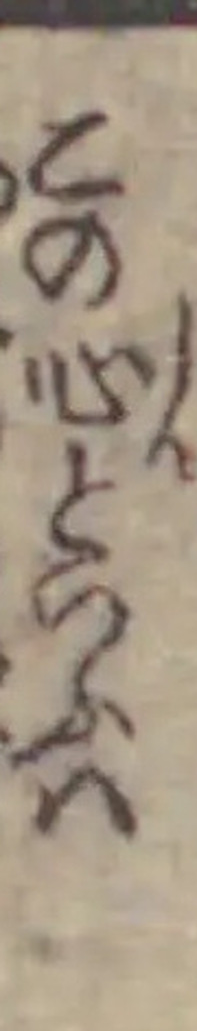この心といふは
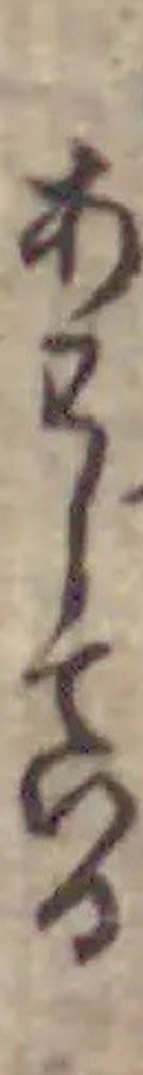あわしている
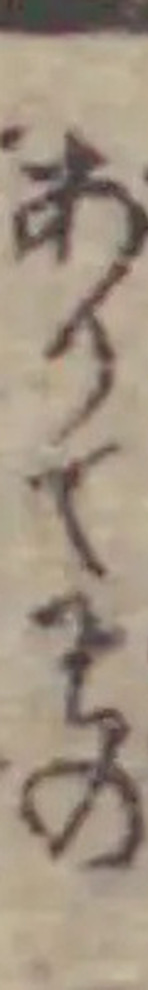ありてその
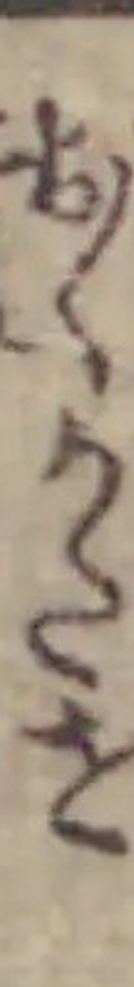おくかたを
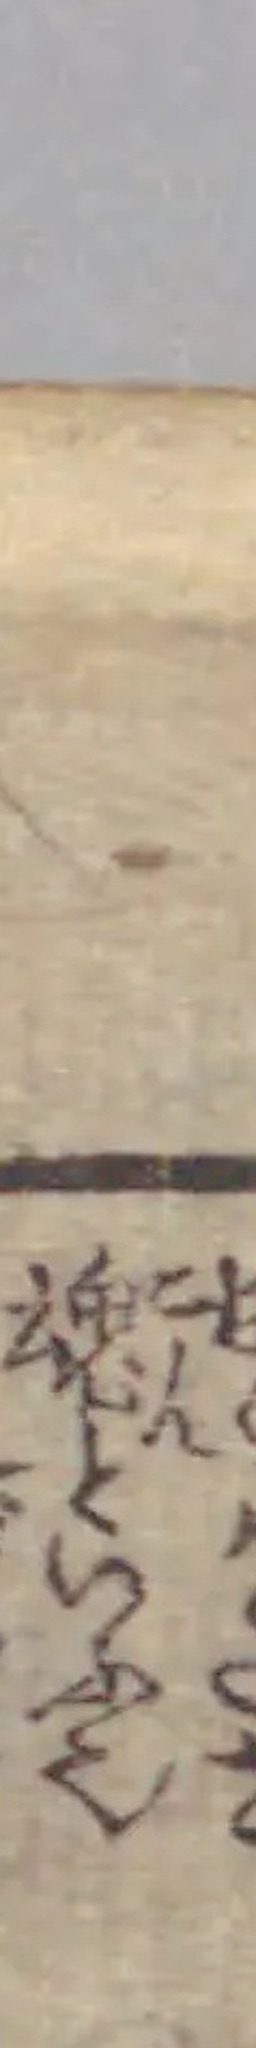魂といふ也
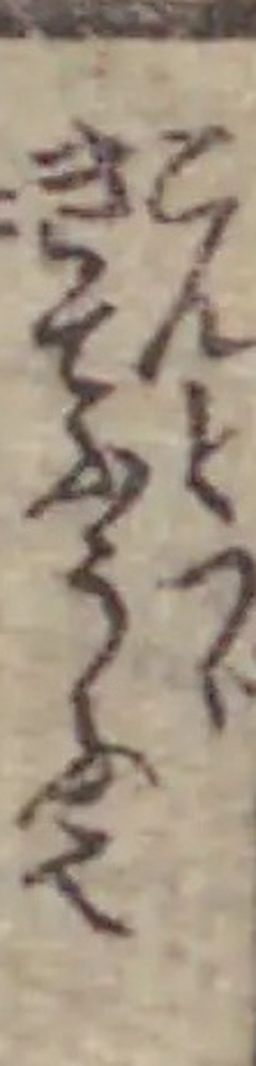きてふうふ也
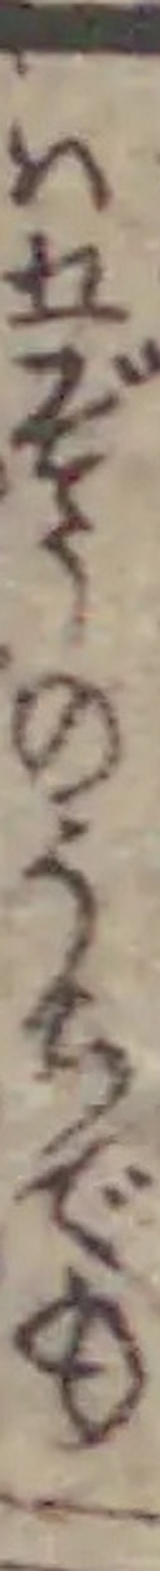は五ぞうのうちでも
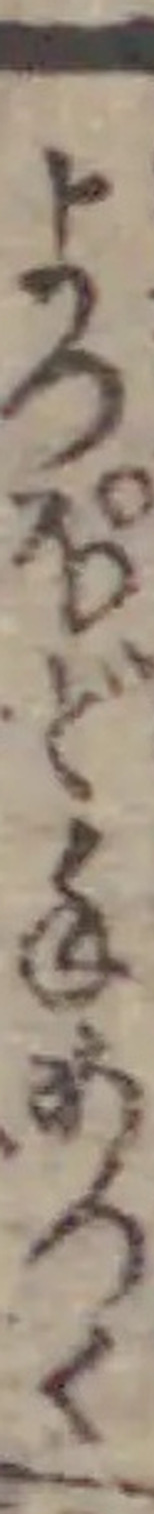よつぽどねめつく
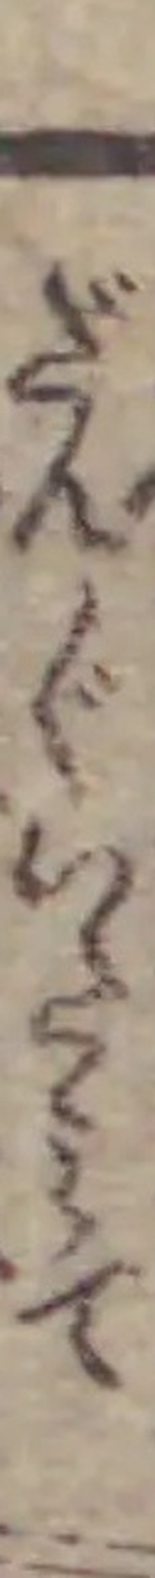だん〴〵いたみて
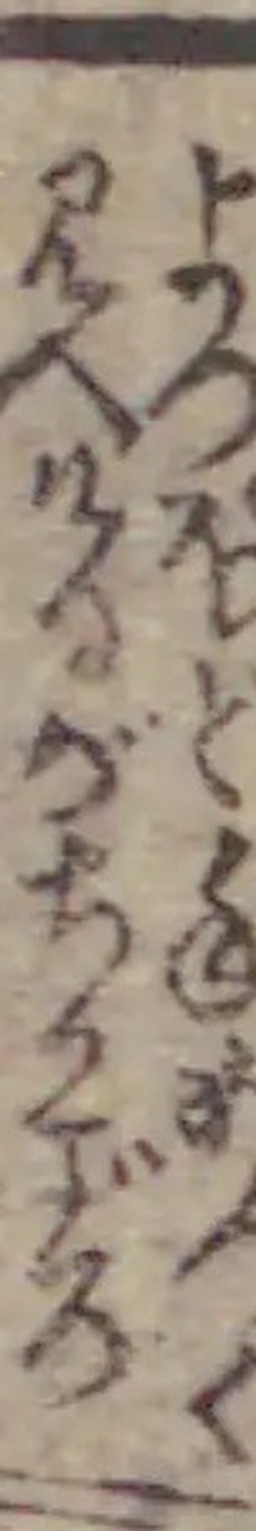見へけるがちかごろ
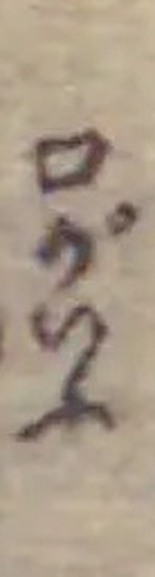口がいふ
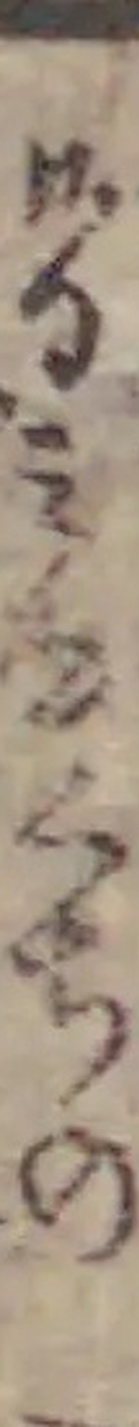けるみなくちの
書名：腹内養生主論 3巻
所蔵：国立国会図書館 National Diet Library, JAPAN
